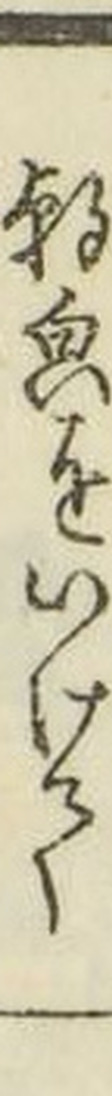朝貌をいけて
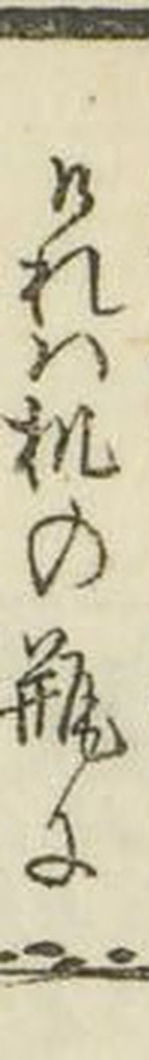けれは几の瓶に
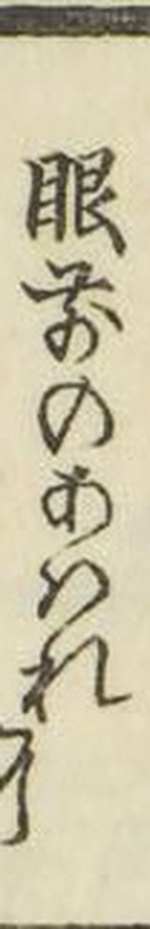眼前のあはれに
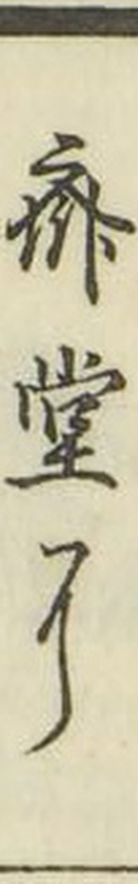斎堂に
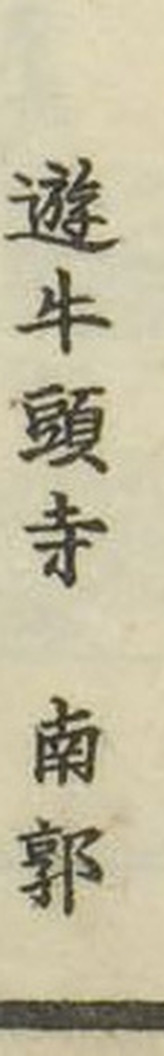遊牛頭寺南郭
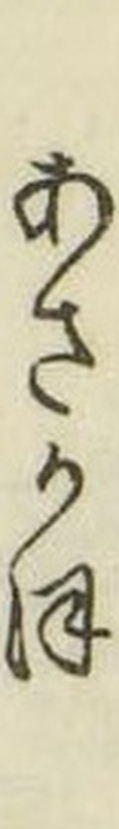あさかほ
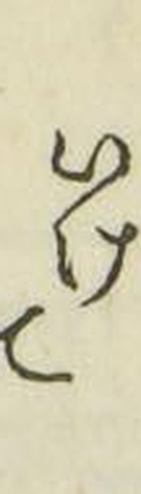いけて
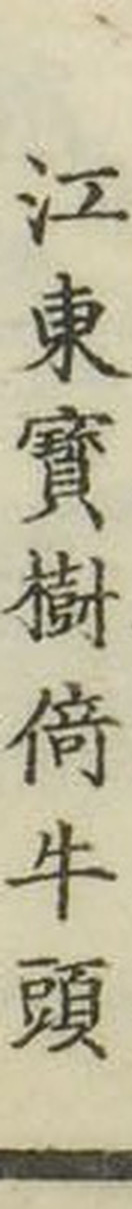江東宝樹倚牛頭
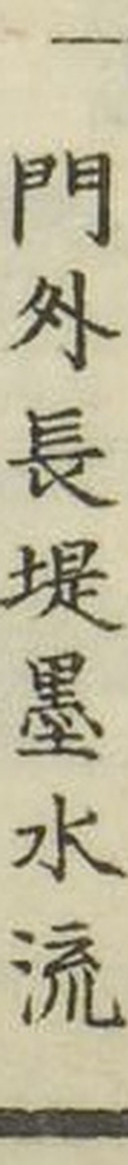門外長堤墨水流
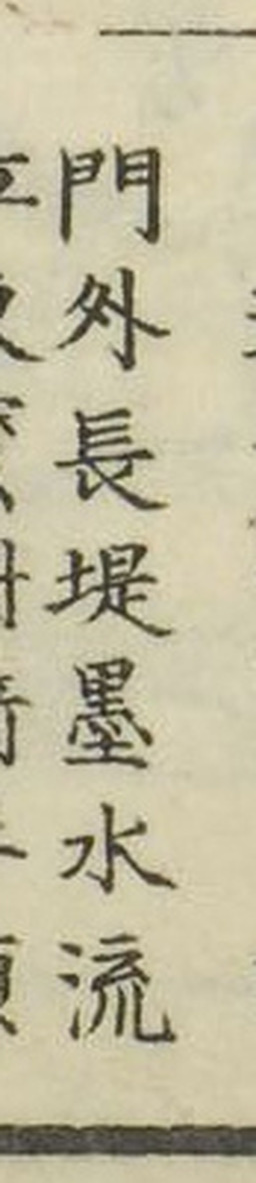門外長堤墨水流
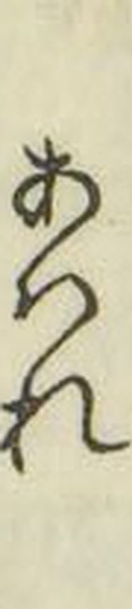あはれ
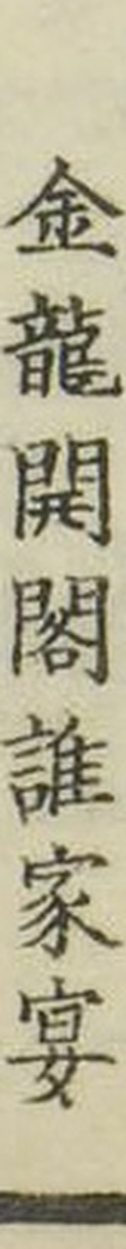金竜開閣誰家宴
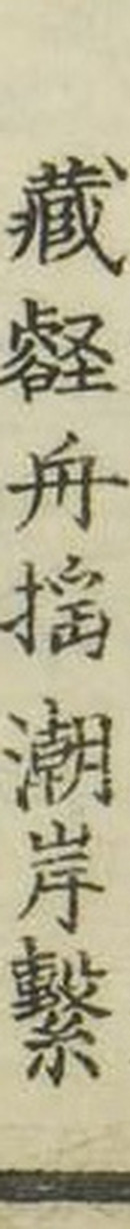蔵壑？舟揺潮岸繋
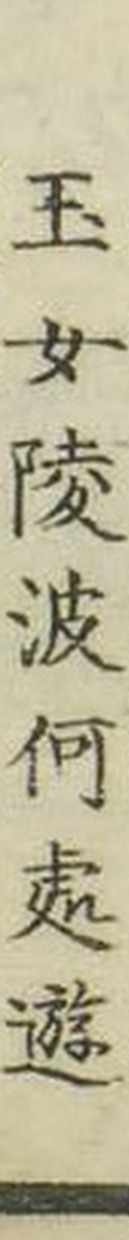玉女陵波何処遊
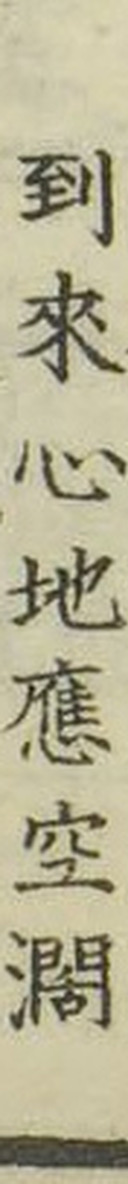到来心地応空濶
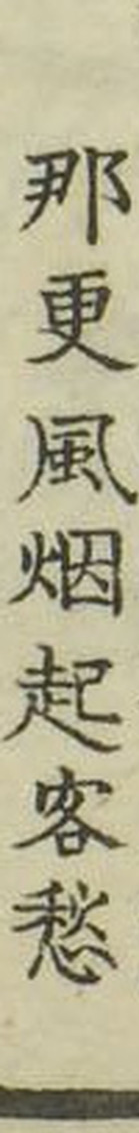那更風煙起客愁
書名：江戸名所図会 20巻 巻之19
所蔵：東京学芸大学教育コンテンツアーカイブ
